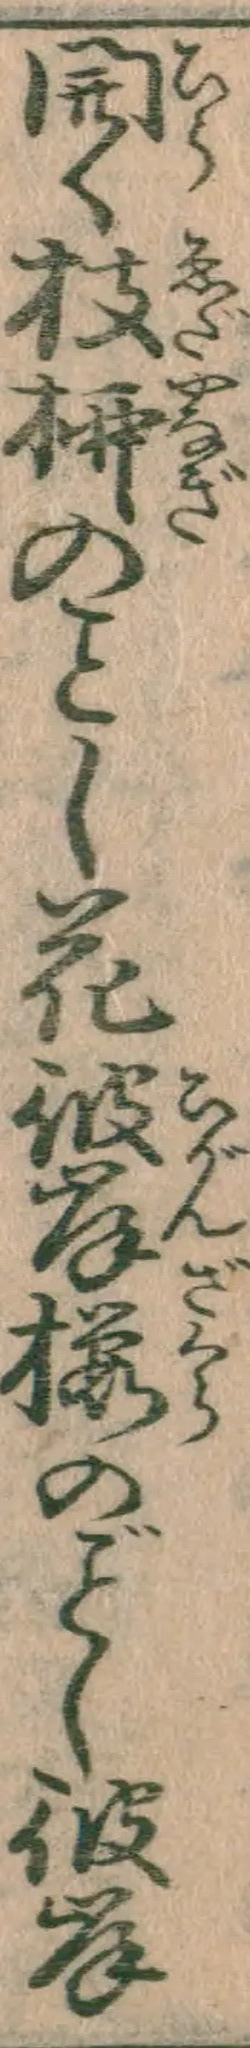開く枝柳のことし花彼岸桜のごとし彼岸
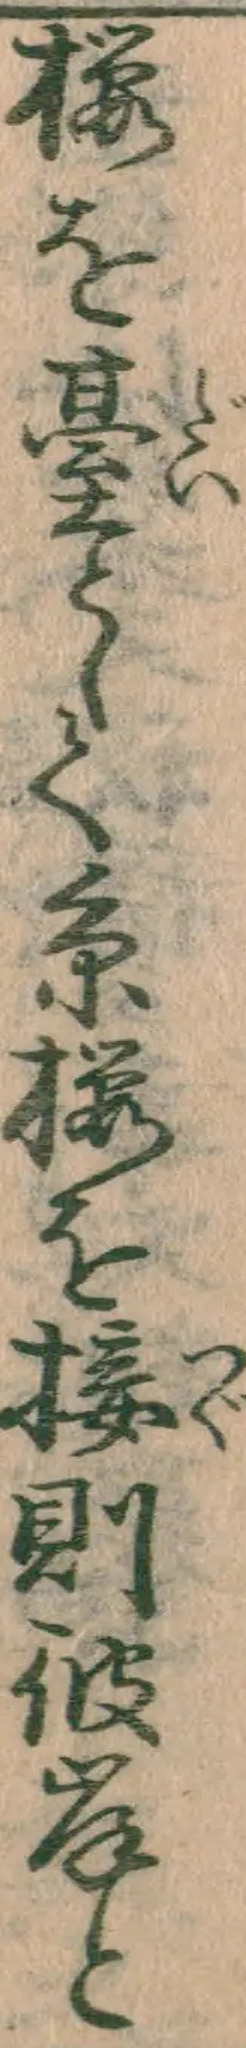桜を台として糸桜を接則彼岸と
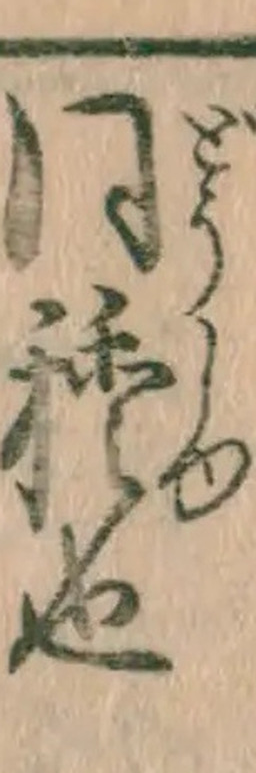同種也
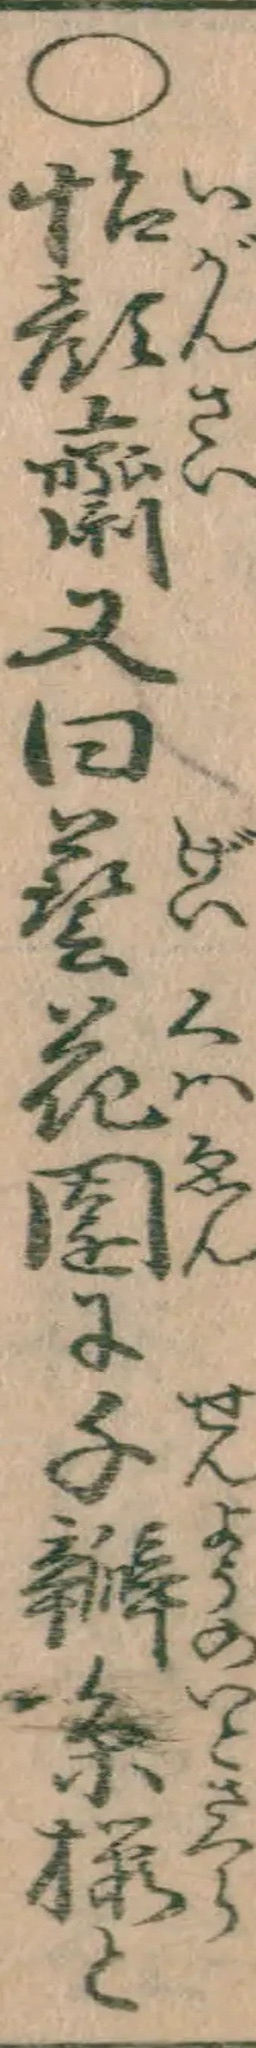○怡顔斎又曰芸花園に千弁糸桜と
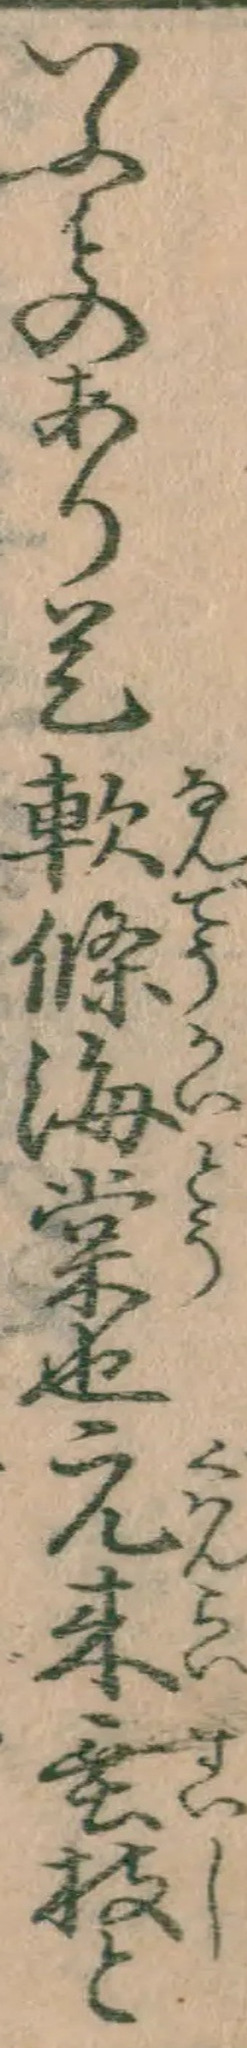いふものあり是軟條海棠也元来垂枝と
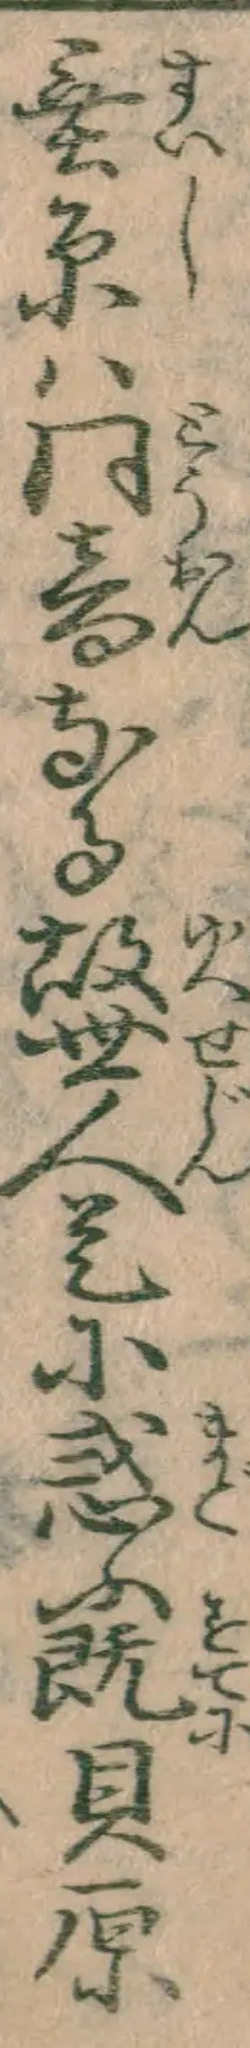垂糸は同音なる故世人是に惑ふ既貝原
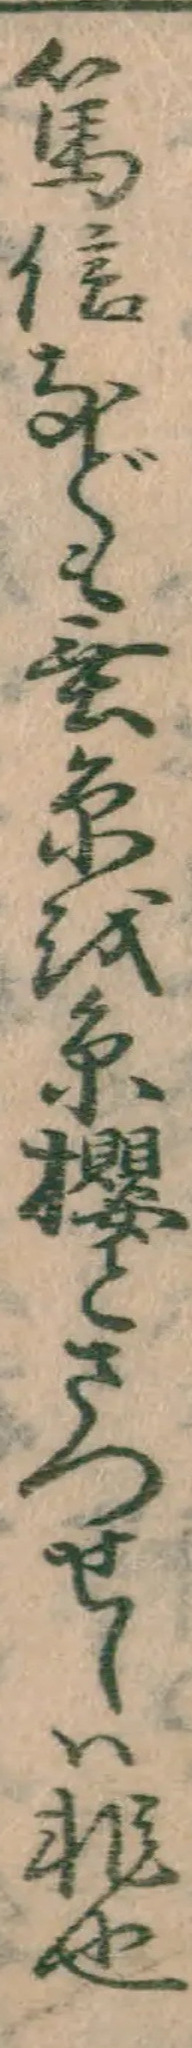篤信なども垂糸を糸桜とさつせしは非也
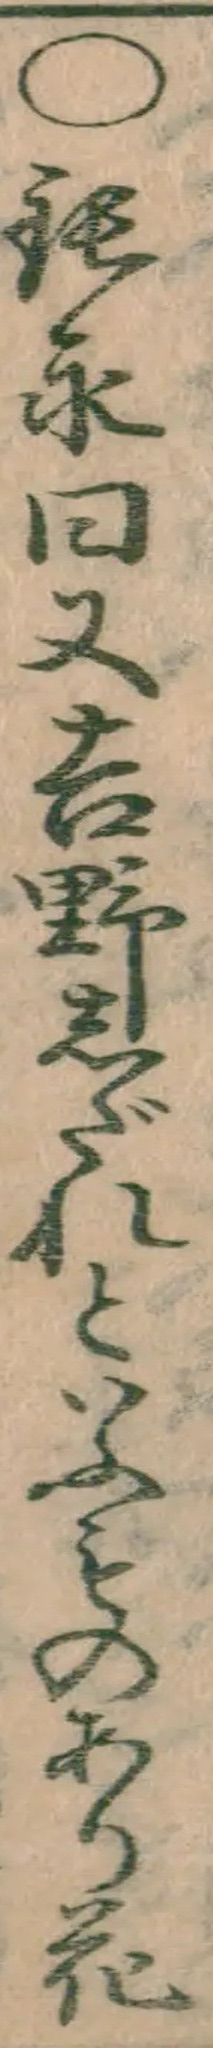○鈍永曰又吉野しだれといふものあり花
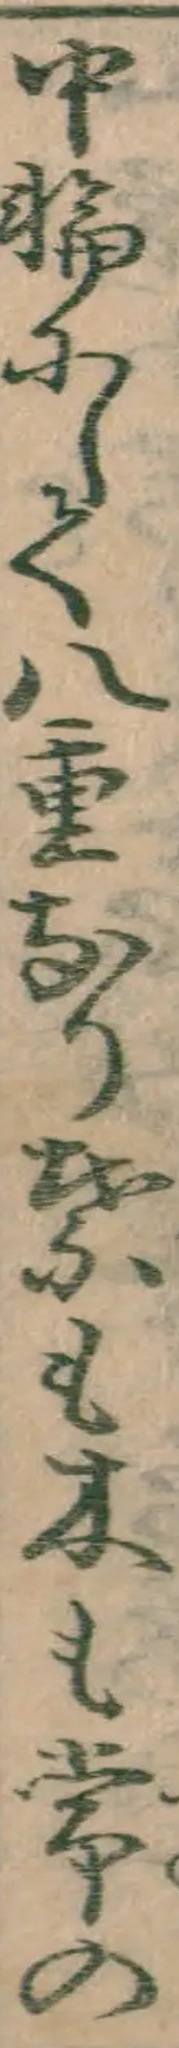中輪にして八重なり葉も木も常の

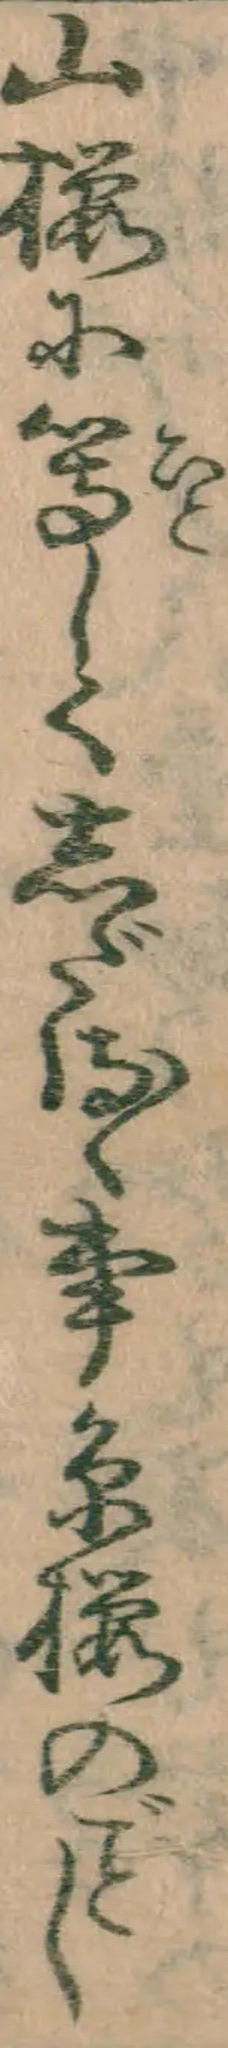山桜に等しくしだるゝ事糸桜のごとし
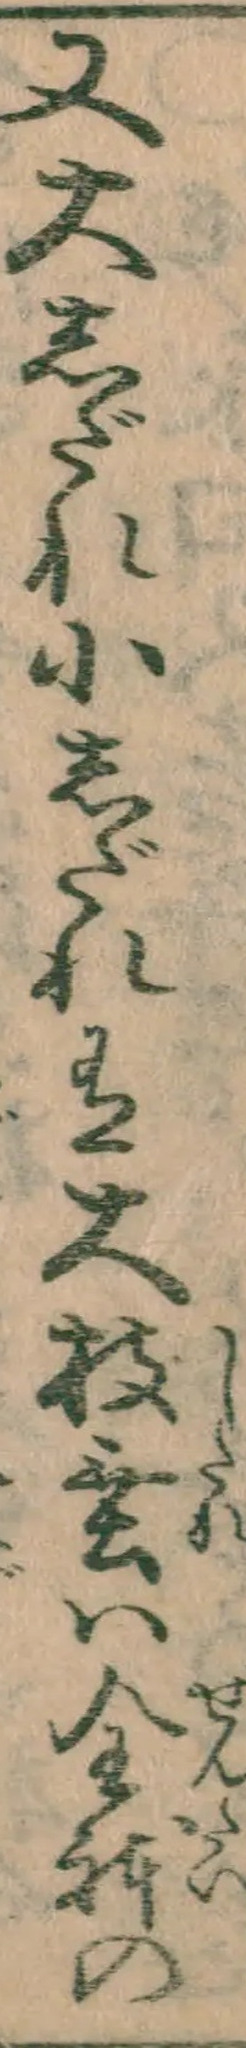又大しだれ小しだれ有大枝垂は全体の
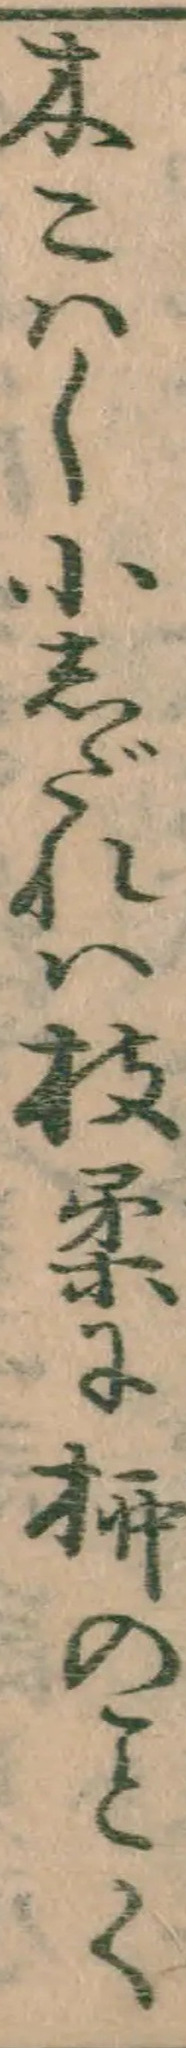木こはし小しだれは枝柔に柳のことく
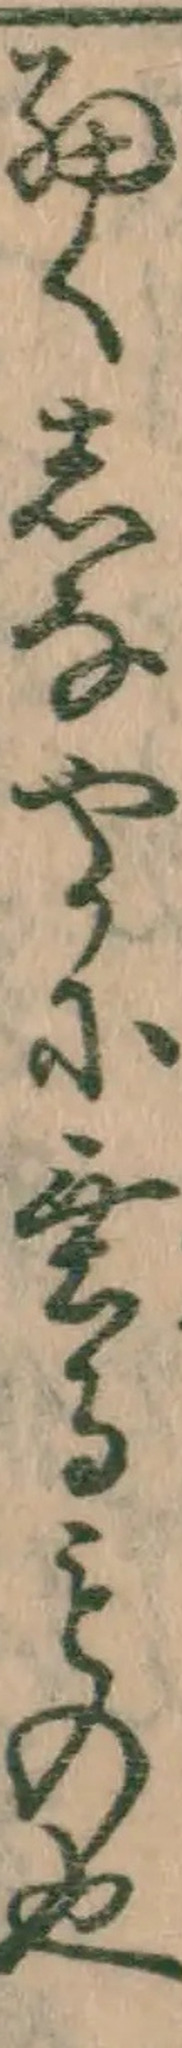細くしなやかに垂るもの也
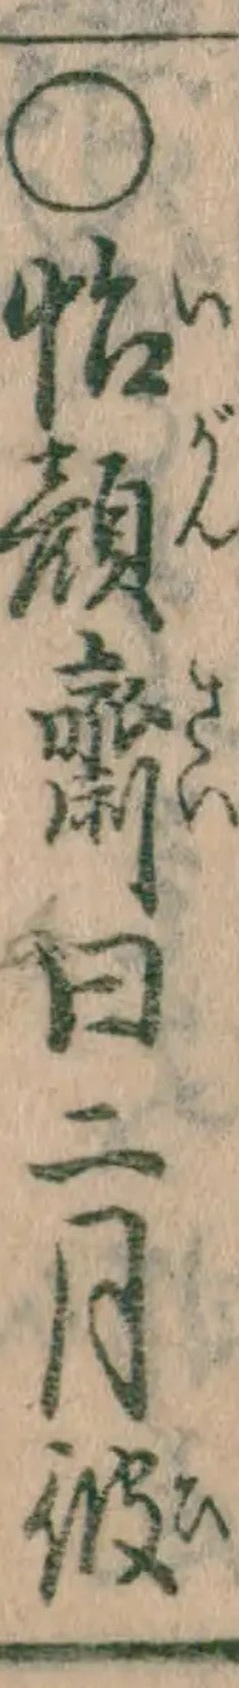○怡顔斎曰二月彼
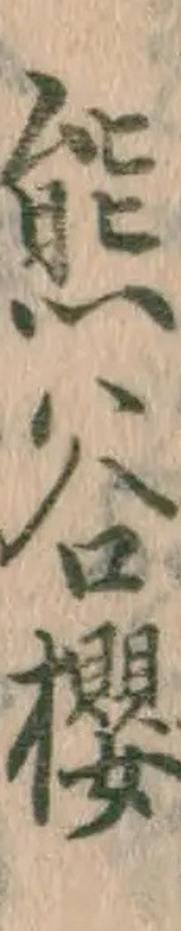熊谷桜
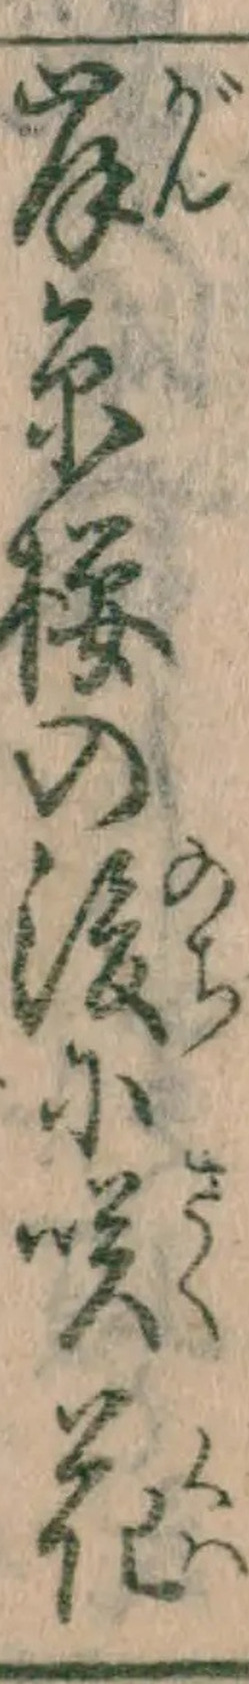岸糸桜の後に咲花
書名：怡顔齋櫻品
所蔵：国立国会図書館 National Diet Library, JAPAN
